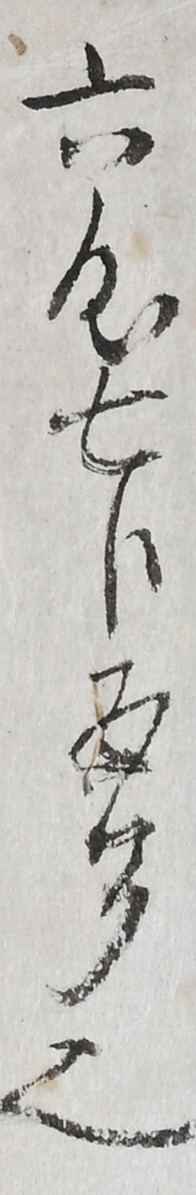六匁七分五厘也
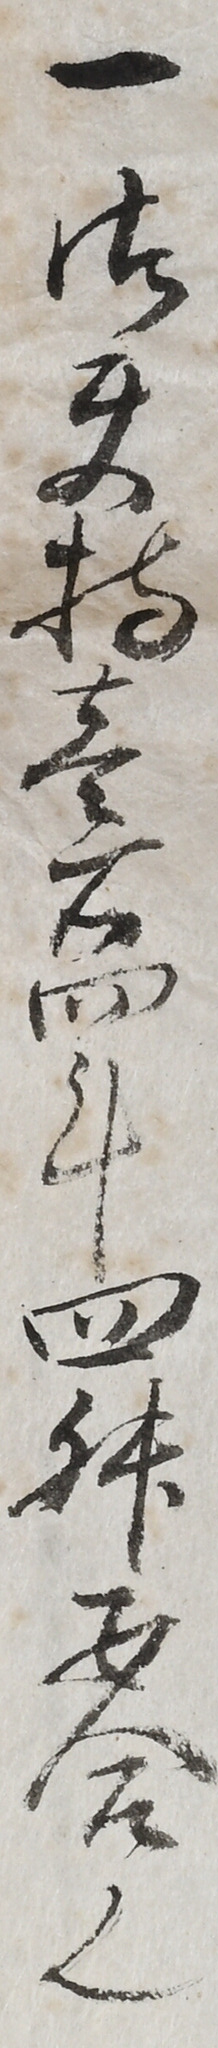一御夫持壱石四斗四升五合也
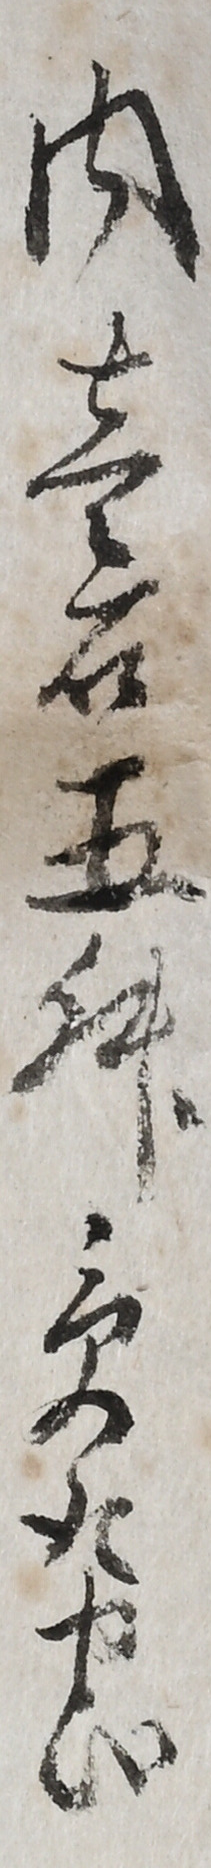内壱石五升受取申候
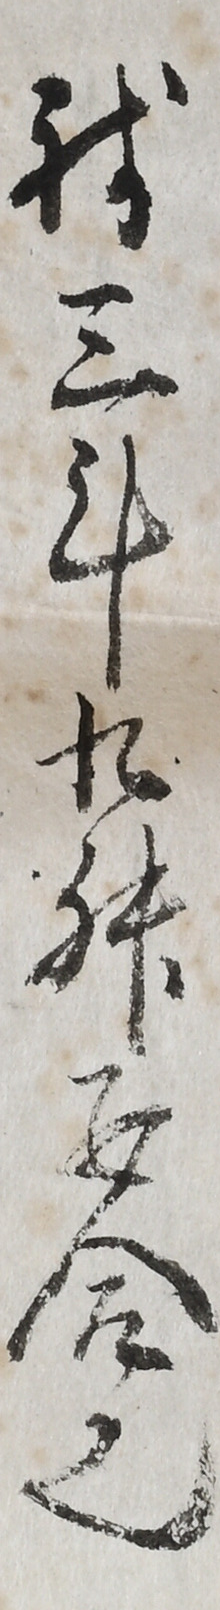残三斗九升五合也
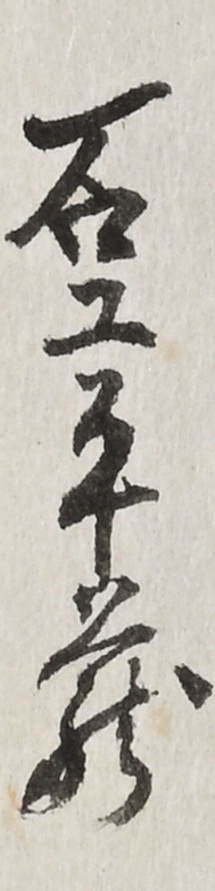石工平蔵

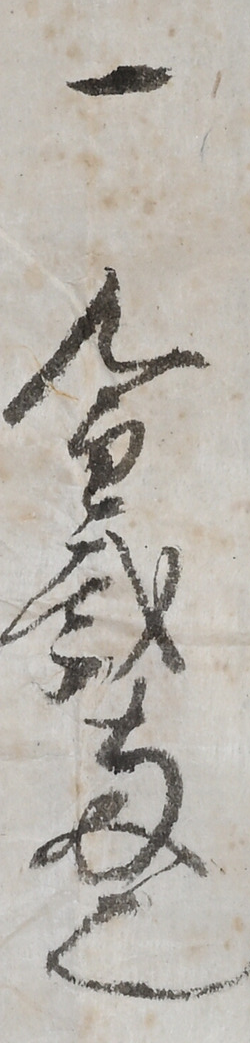一金弐両也
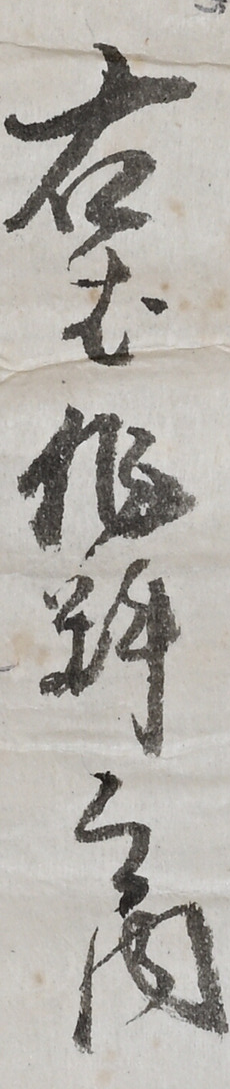右は作料之内
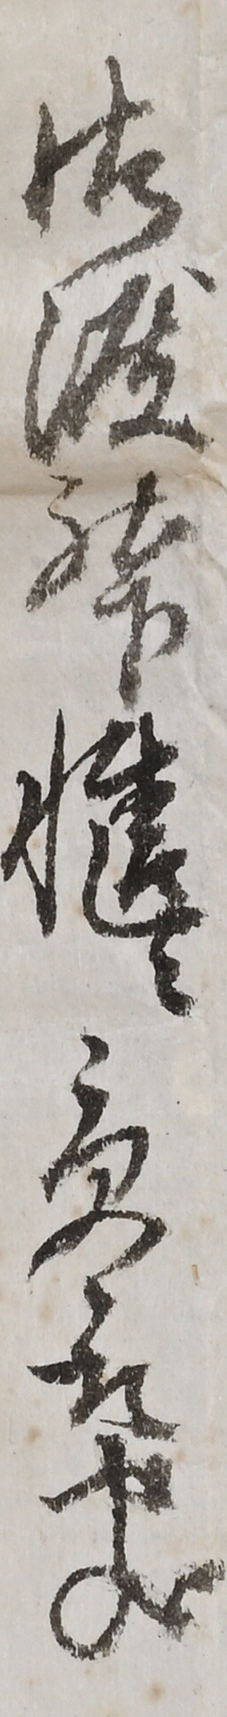御渡被下慥ニ受取申候
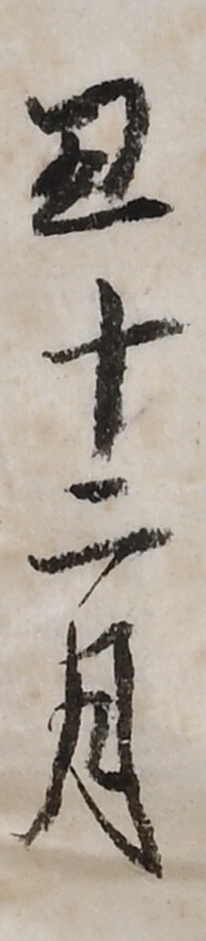丑十二月
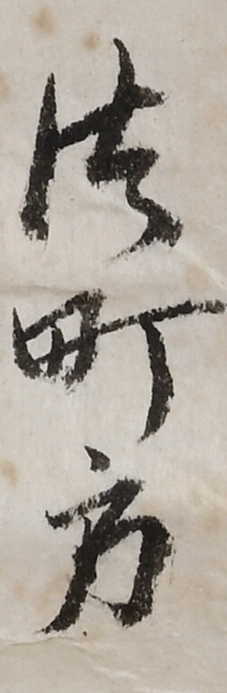御町方
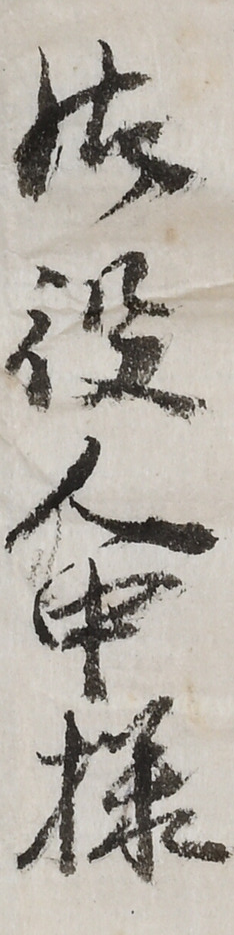御役人中様
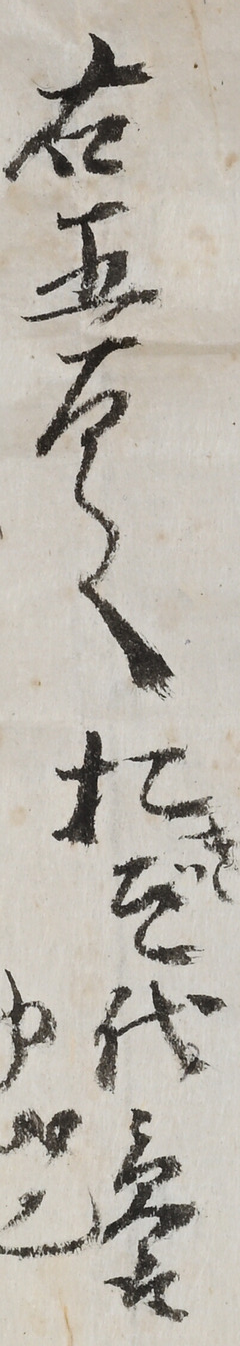右五百文たきぎ代受取

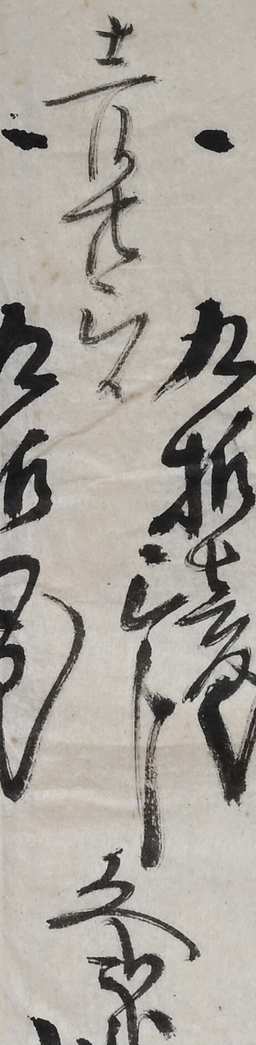十二月廿三日文弐弐
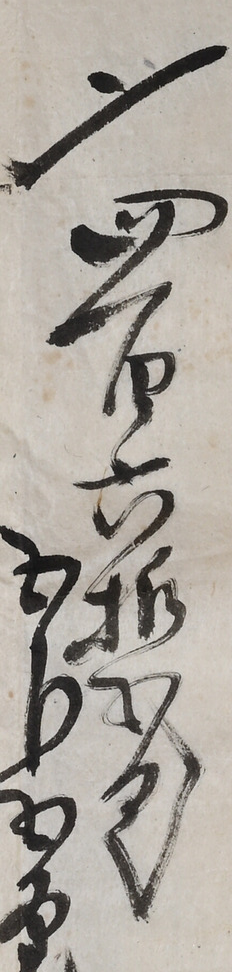〆四百六拾五匁
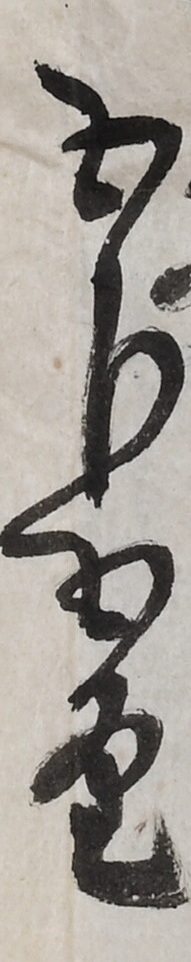五分五厘
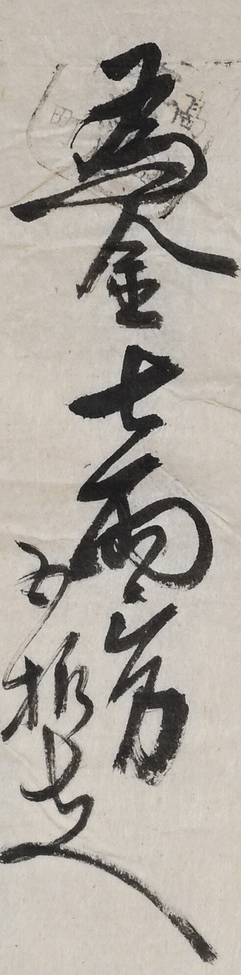為金七両三分
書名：町方木戸御普請諸事附（一括）
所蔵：伊那市立高遠町図書館・合同会社AMANE
